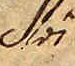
Sôs
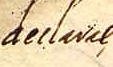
declaraç
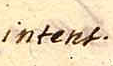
intent.
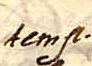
temp.
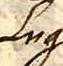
Lug
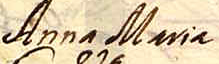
Anna Maria
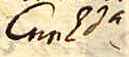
Cunhda
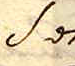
Sôs
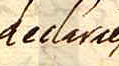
declaraç
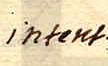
intent.
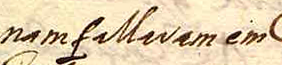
nam fallavam em
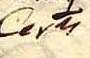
Ceras
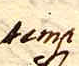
temp
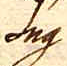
Lug
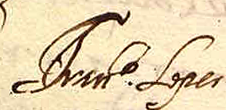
Franco. Lopes
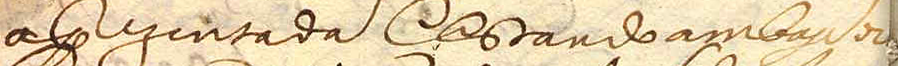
aprezentada E Estando ambas Sos
